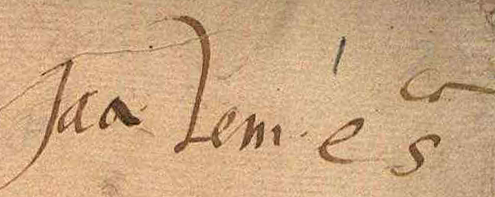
Jaa Lem. e sça
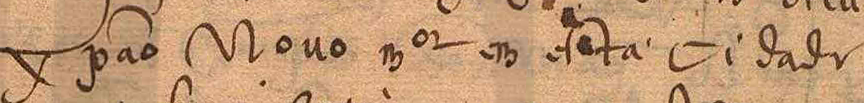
Xpão Nouo mor em esta Cidade
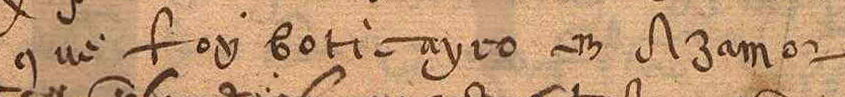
que foy boticayro em Azamor
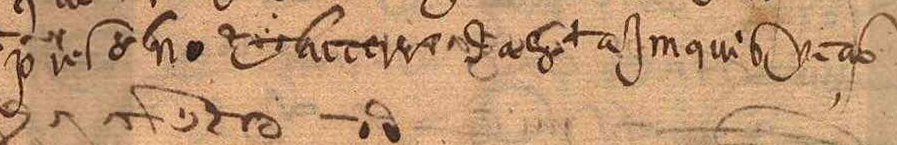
preso no Carcere da Sta Jmquisyçaõ
